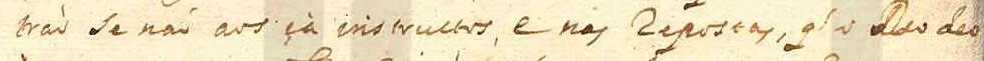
traõ se naõ aos ià instructos, e nas Repostas, q̄ o Reo deo
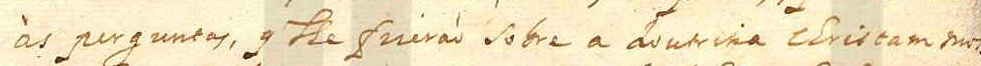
às perguntas, q̄ lhe fizeraõ sobre a doutrina christam mos
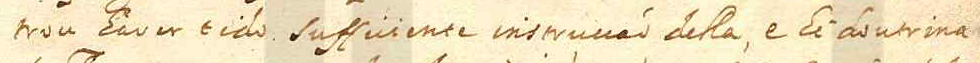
trou haver tido sufficiente instrucçaõ della, e hé doutrina
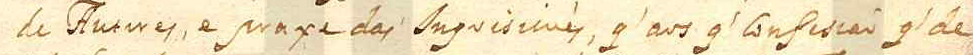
de Autores, e praxe das Inquisições, q̄ aos q̄ Confessaõ q̄ de
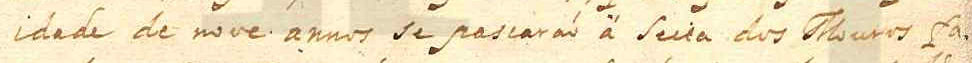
idade de nove annos se passaraõ a seita dos Mouros fa
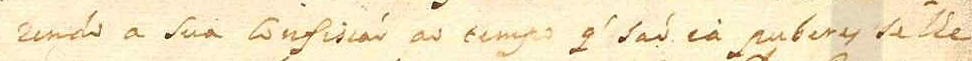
zendo a sua Confissaõ ao tempo q̄ saõ ià puberes se lhe
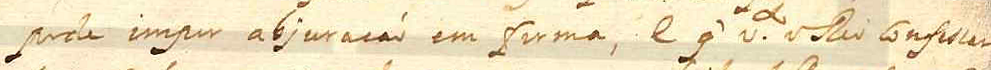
pode impor abjuraçaõ em forma, e q̄ v.to o Reo confessar
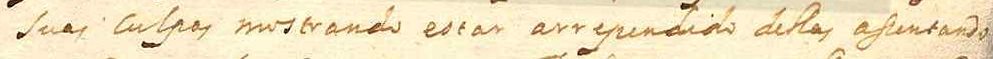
suas culpas mostrando estar arrependido dellas assentando
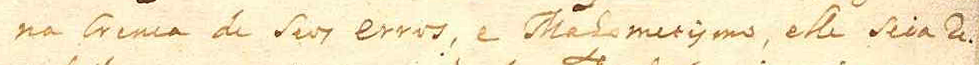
na crença de seos erros, e Mahometismo, elle seia Re
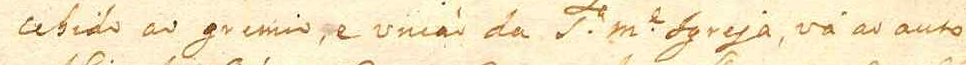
cebido ao gremio, e vniaõ da s.ta m.e Igreja, vá ao auto
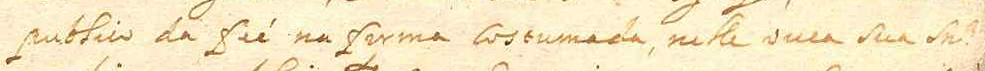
publico da feé na forma costumada, nelle ouça sua sn.a
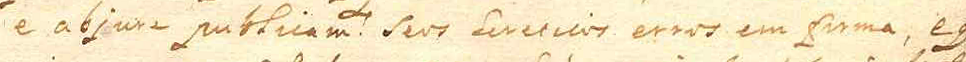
e abjure publicam.te seos hereticos erros em forma, e q̄
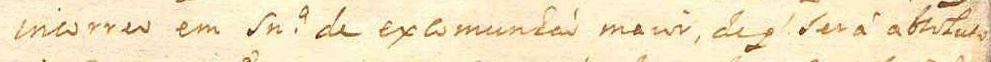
incorreo em sn.a de excomunhaõ maior, de q̄ será absoluto
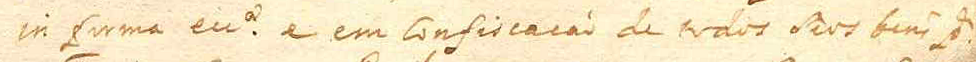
in forma ecc.æ e em confiscaçaõ de todos seos bens pa
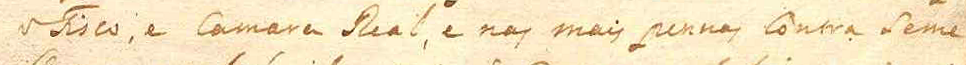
o Fisco, e Camara Real, e nas mais pennas contra seme
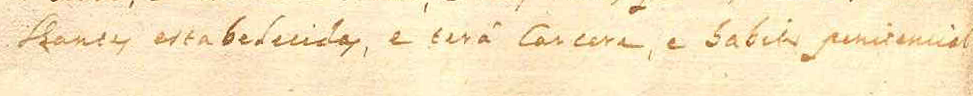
lhantes estabelecidas, e terá Carcere, e habito penitencial
